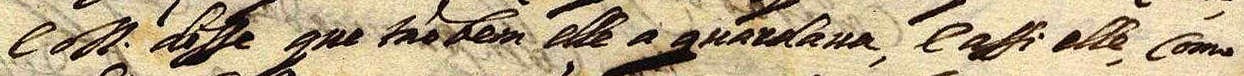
e o R. disse que taõbem elle a guardaua, E assi elle, como
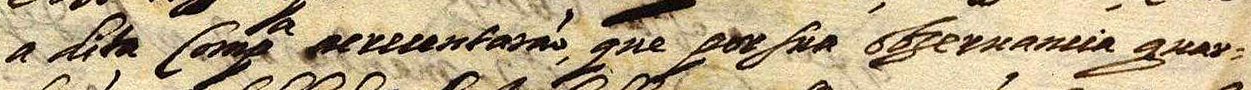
a ditta Compa acrecentaraõ, que por sua obzeruancia guar
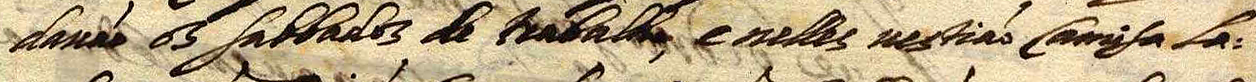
dauaõ os sabbados de trabalho, e nelles uestiaõ Camisa La
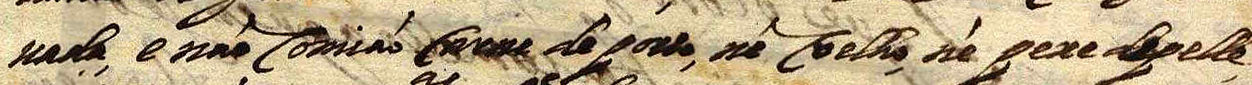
uada, e naõ Comiaõ Carne de porco, nē Coelho, nē pexe de pelle,
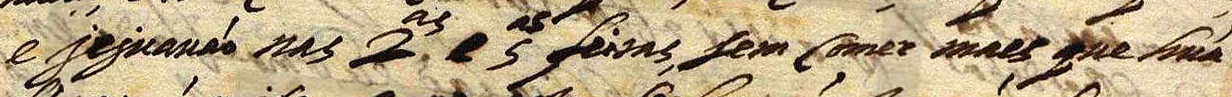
e jejuauão nas 2as e 5as feiras, sem Comer maes que huā
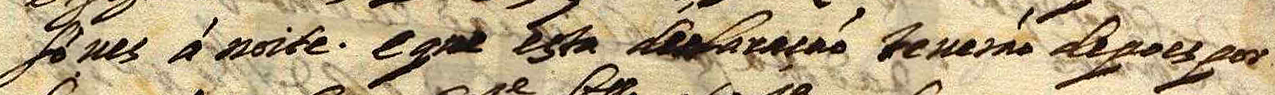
só ues á noite. e que esta declaraçaõ teuerão depoes por
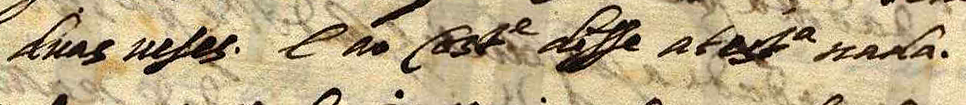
duas ueses. E ao Coste disse a testa nada.
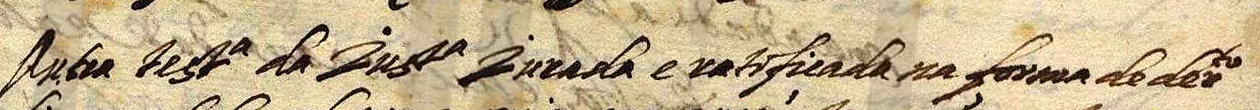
Outra testa da Iusta Iurada e ratificada na forma de derto
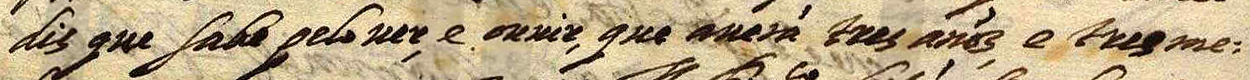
dis que sabe pelo uer, e ouuir, que auerá tres anōs, e tres me
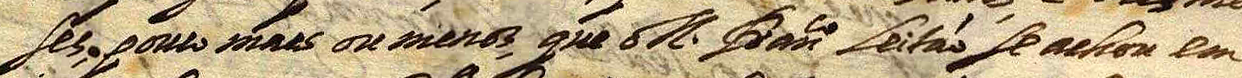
ses, pouco mais ou menos, que o R. Franco Leitaõ se achou em
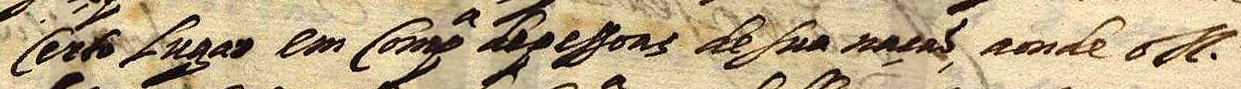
Certo Lugar em Compa de pessoas de sua naçaõ, aonde o R.
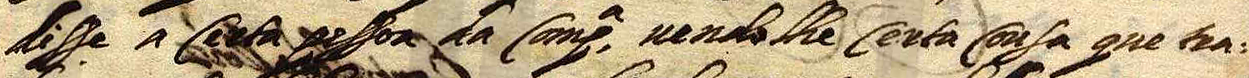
disse a Certa pessoa da Compa, uendolhe Certa Cousa que tra
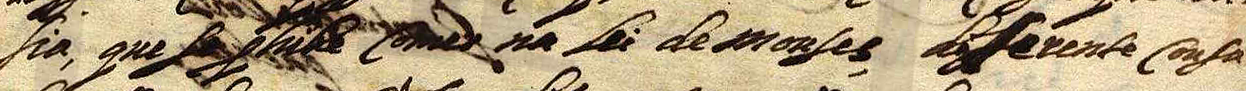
sia, que se ꝓhibe Comer na lei de mouses, diferente Cousa
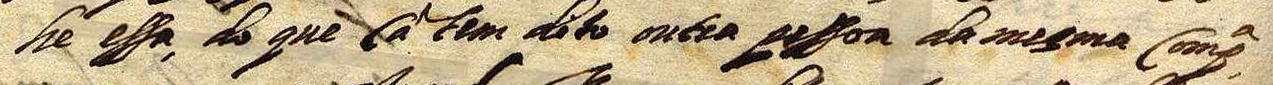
he essa, do que cá tem dito outra pessoa da mesma Compa,
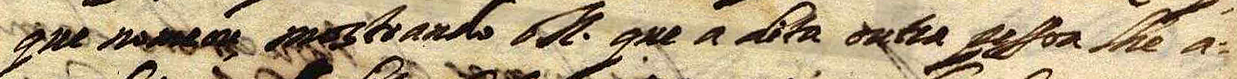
que nomeou, mostrando o R. que a dita outra pessoa lhe a
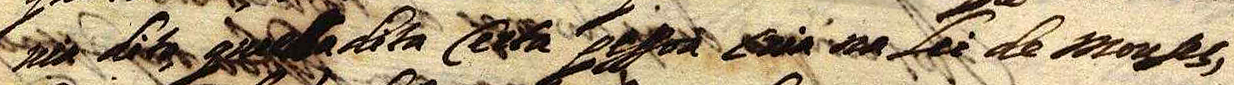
uia dito, que ella dita Certa pessoa cria na Lei de mouses,
